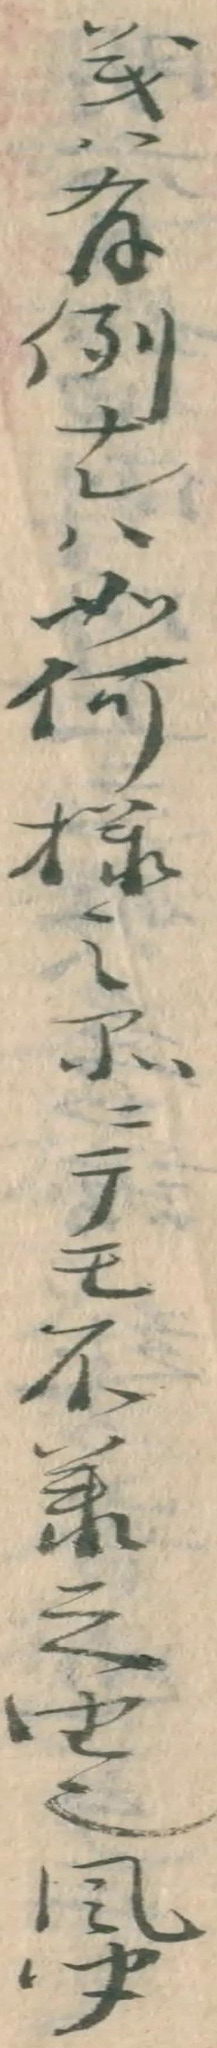義ハ有例ナレハ如何様之品ニテモ不承之由也風聞
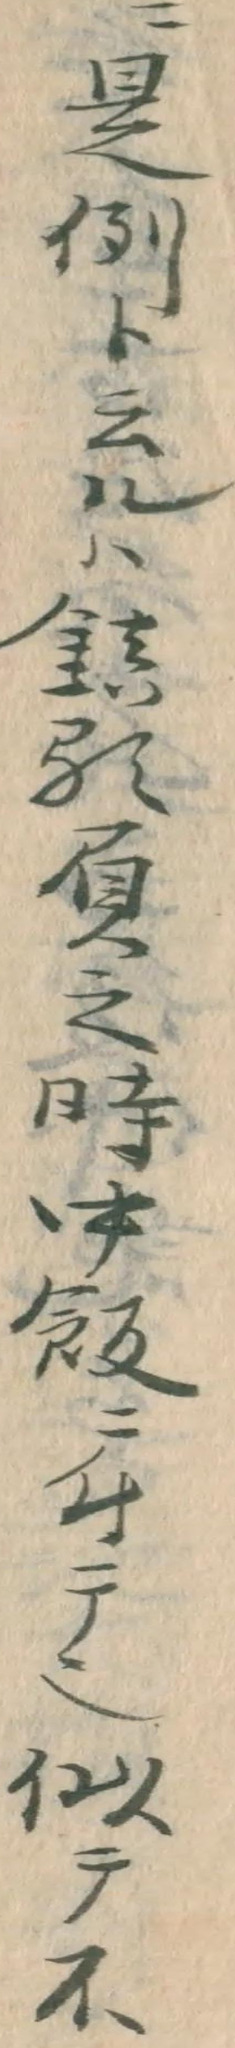ニ是例ト云ルハ鎮顕負之時中飯ニ付テ也似テ不
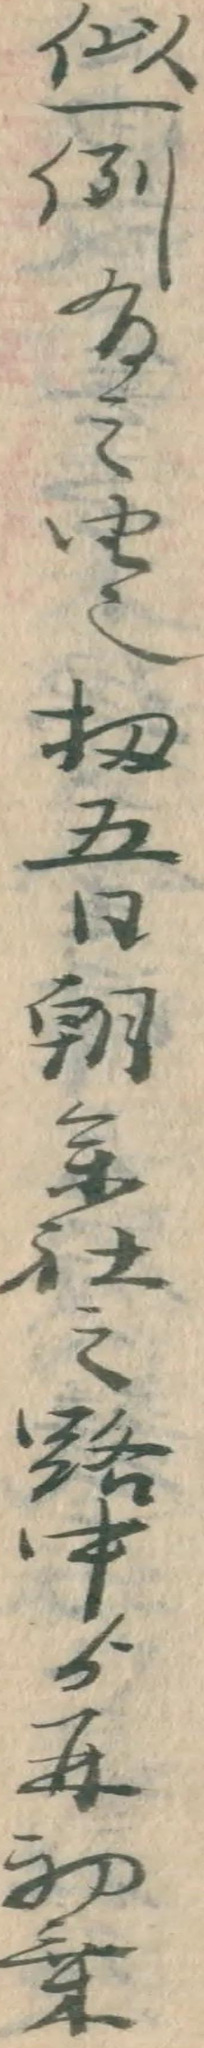似一例有之由也扨五日朝参社之路中ゟ再初乗
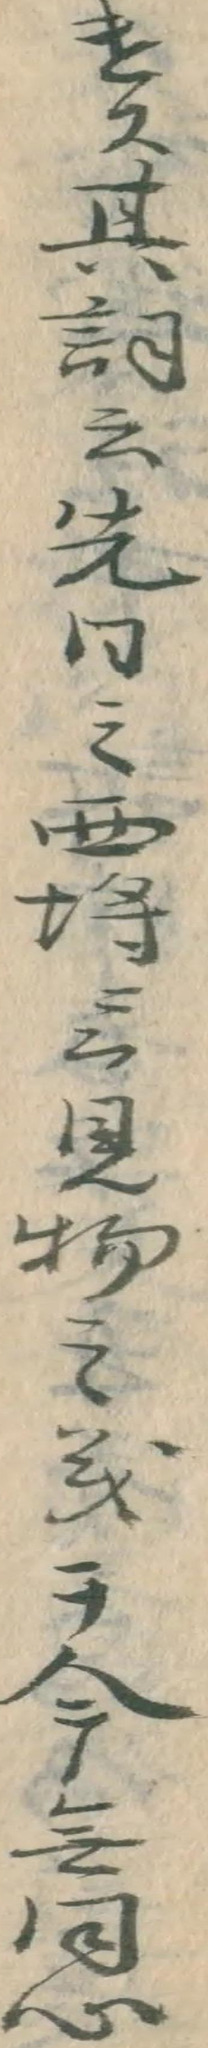遣ス其詞云先日之西将ニ而見物之義ヲ今無同心

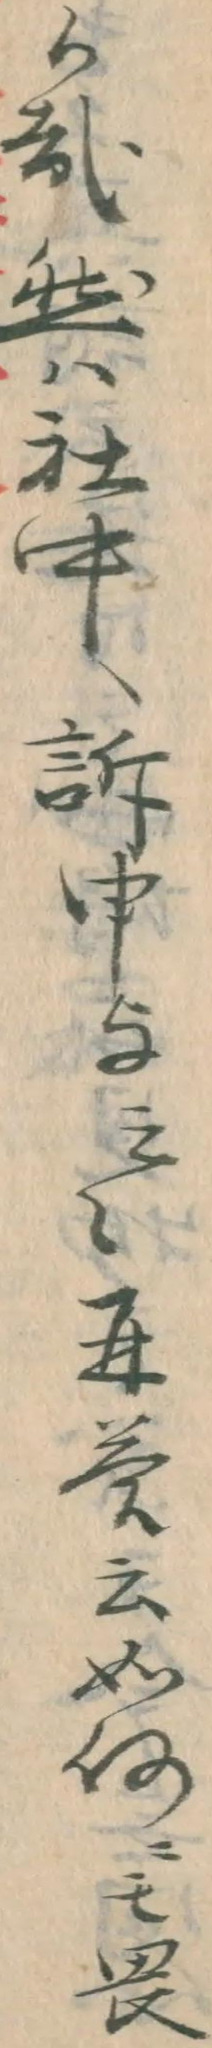候哉然ハ社中ヘ訴申与云々再答云如何ニモ畏
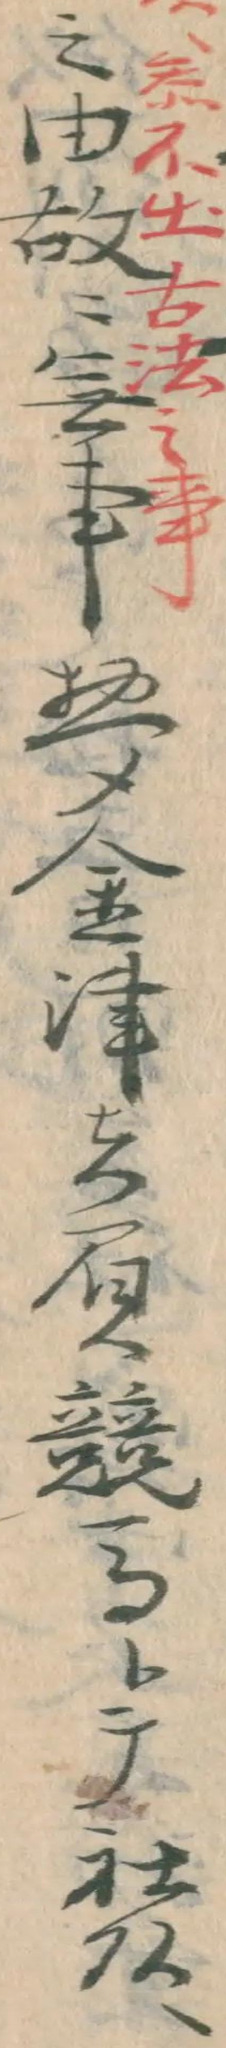之由故ニ無事惣シテ金津者負競馬トテ社頭ヘ
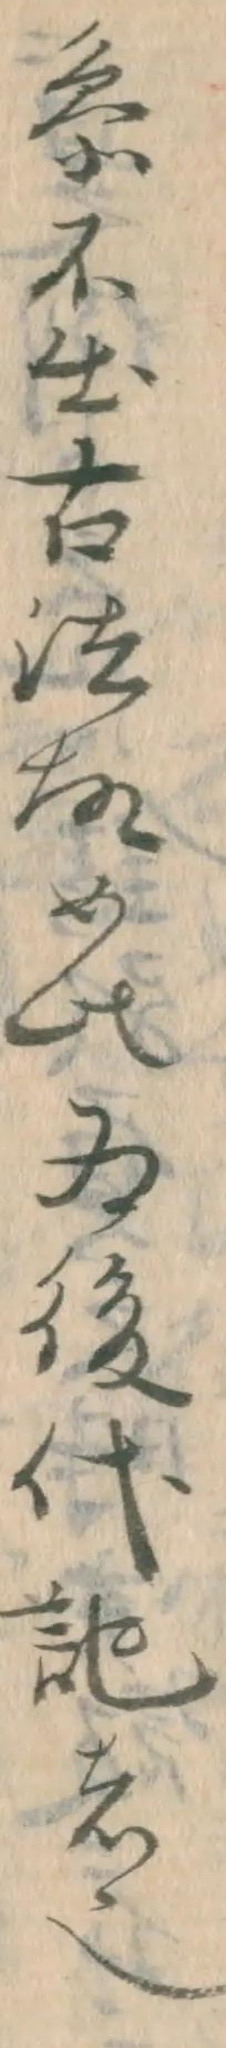参不出古法故如此為後代記者也
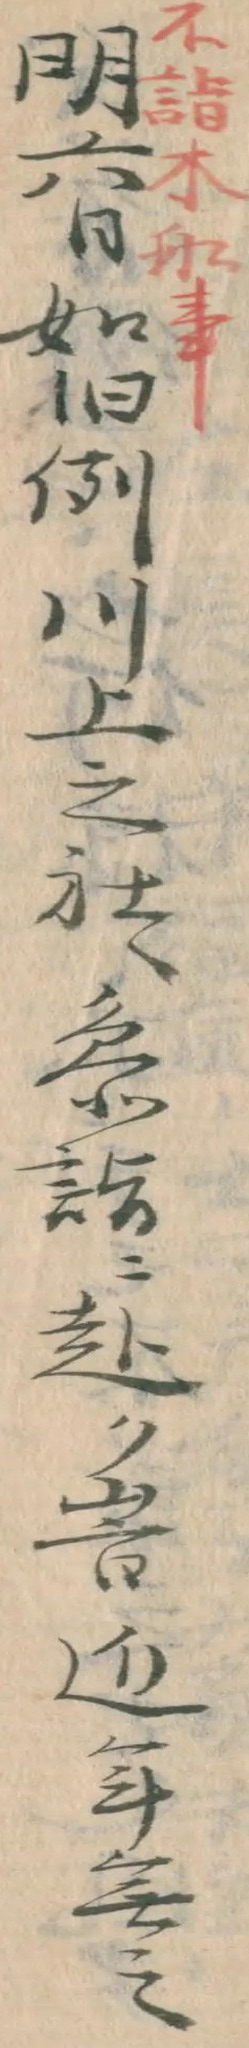明六日如旧例川上之社ヘ参詣ニ赴ク旹近年無之
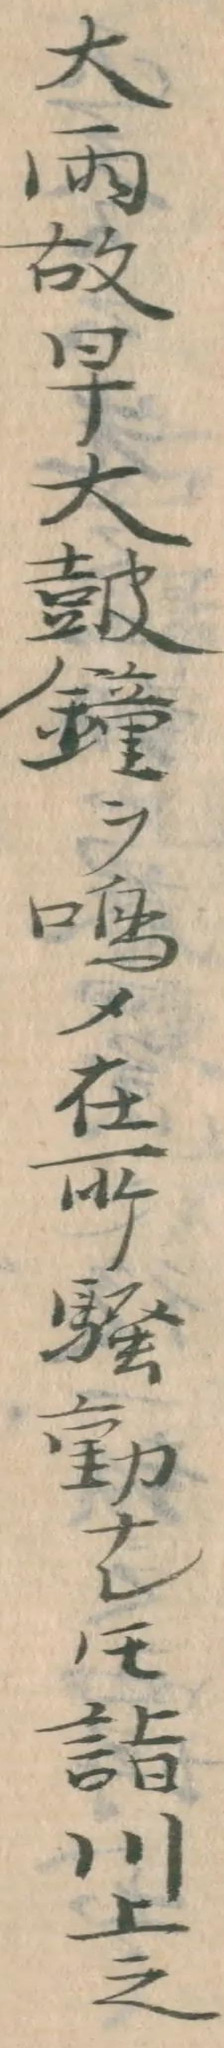大雨故早大鼓鐘ヲ鳴シテ在所騒動ナレトモ詣川上之
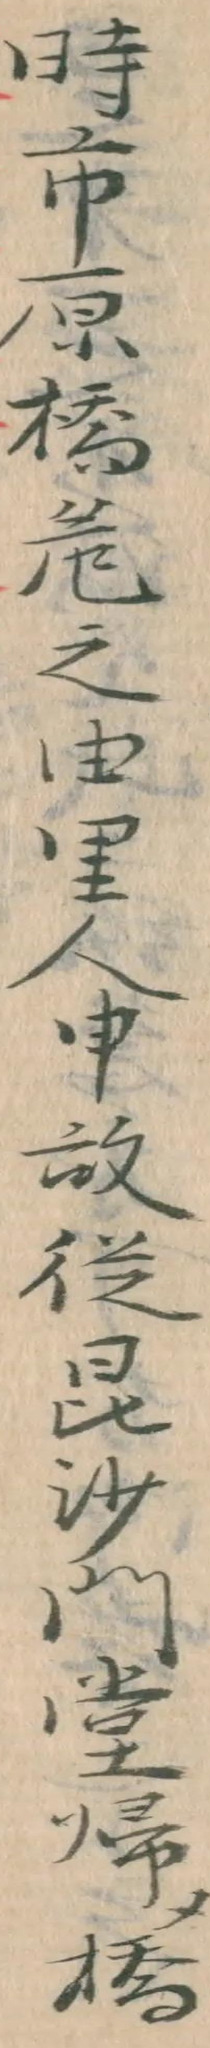時市原橋危之由里人申故従毘沙門堂帰シテ橋
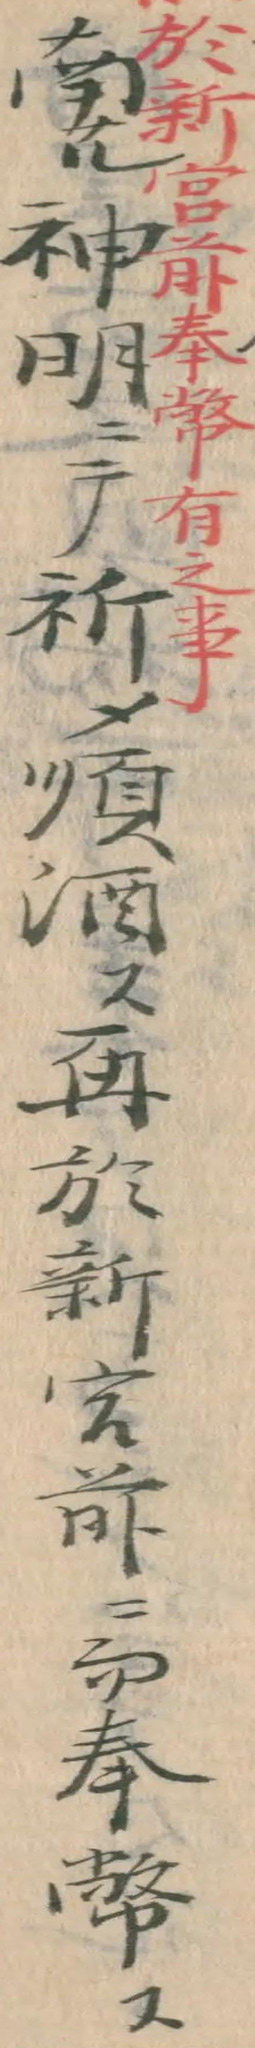南ナル神明ニテ祈シテ順酒ス再於新宮前ニ而奉幣ス
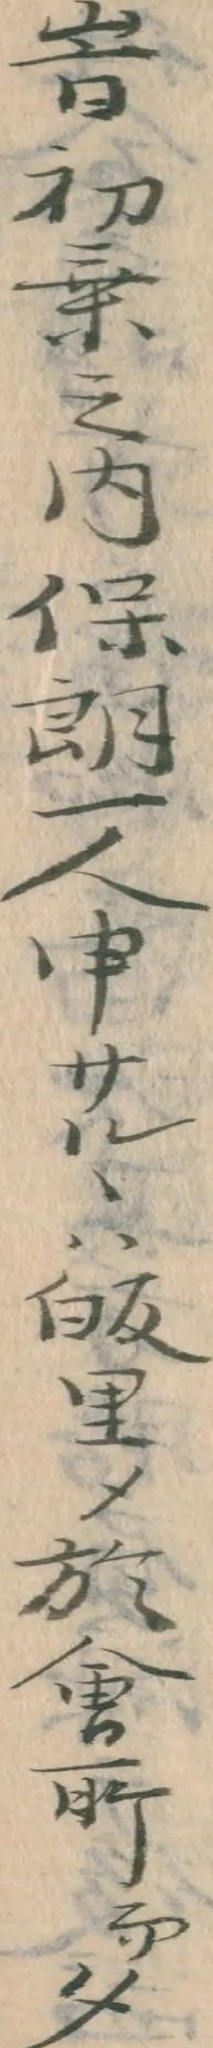旹初乗之内保朗一人申サルヽハ皈里シテ於会所而夕
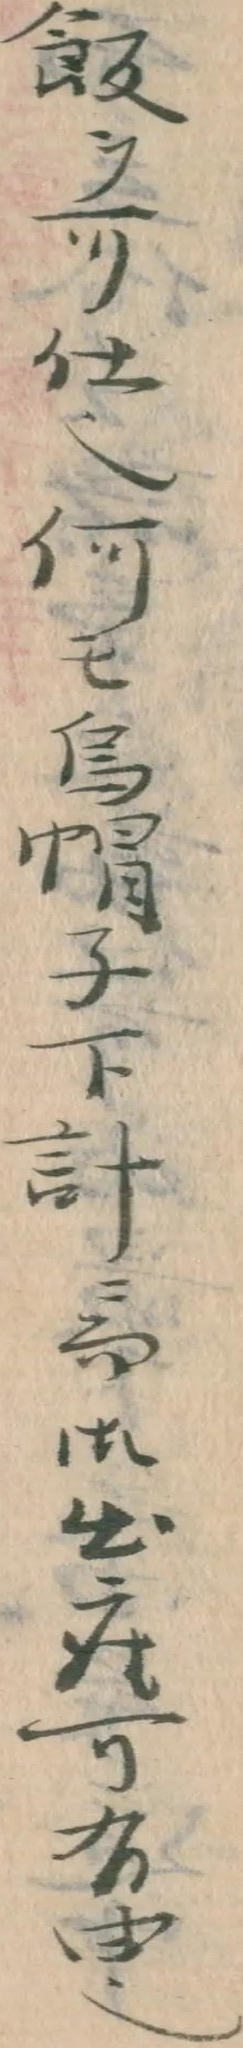飯ヲ可仕也何モ烏帽子下計ニ而御出座可有由也
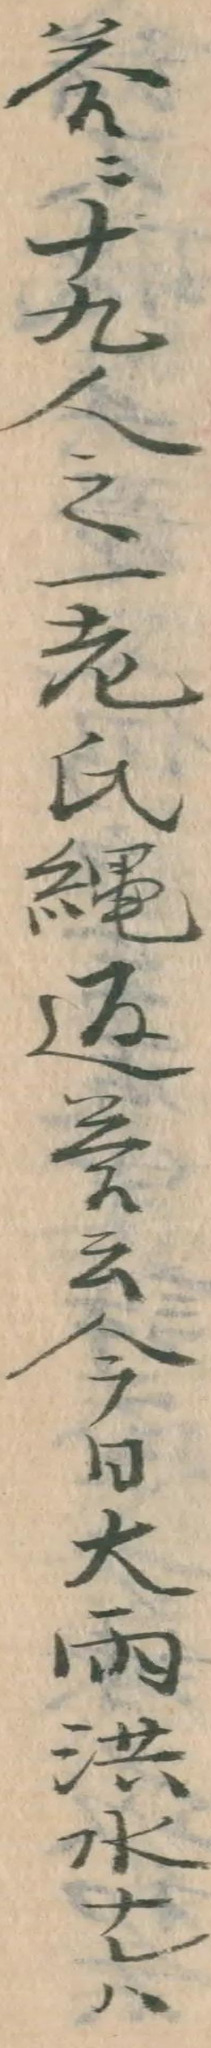答ニ十九人之一老氏縄返答云今日大雨洪水ナレハ
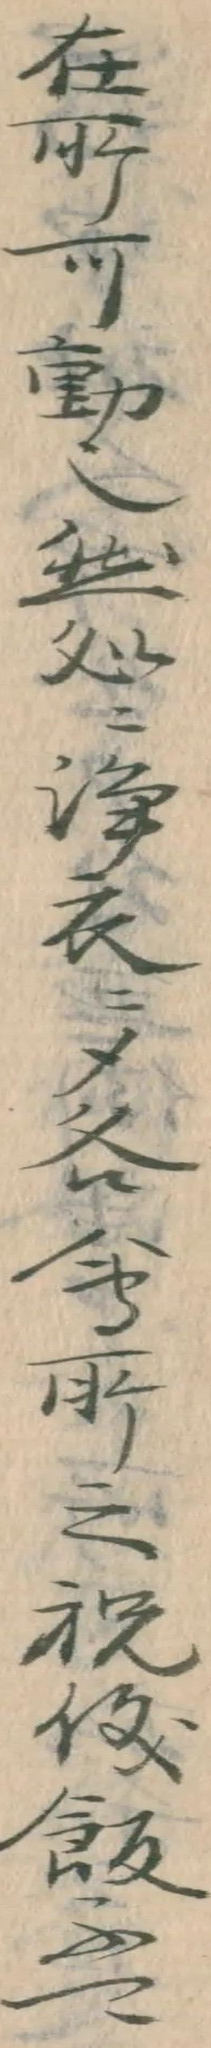在所可動也然処ニ浄衣ニシテ各会所之祝儀飯不可
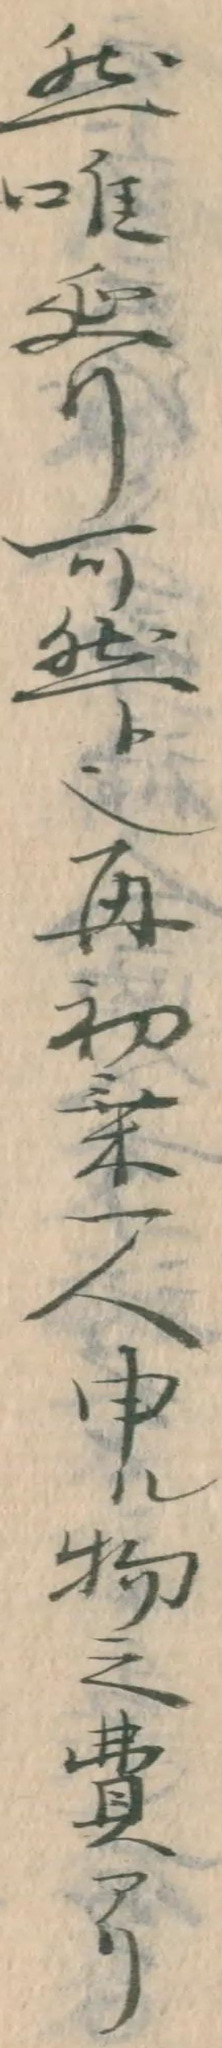然唯延引可然ト也再初乗一人申ル物之費アリ
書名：賀茂社記録. 第10冊
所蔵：国立国会図書館 National Diet Library, JAPAN
